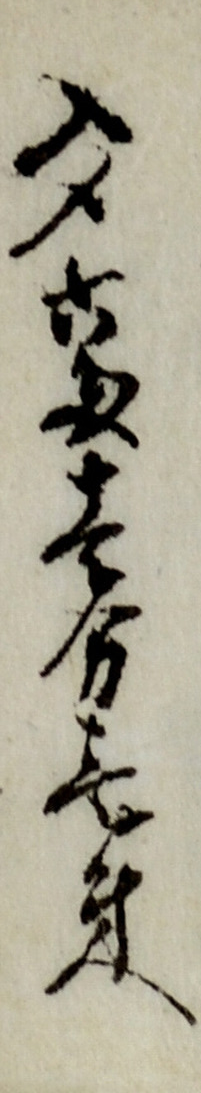入〆六両壱分壱朱

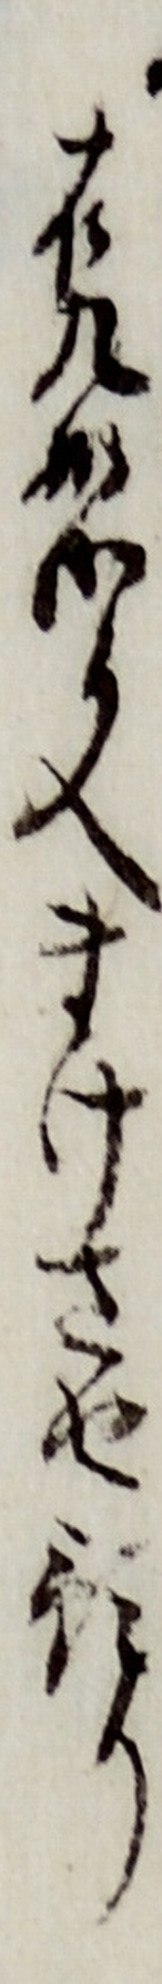右九拾弐文まけさせ預り
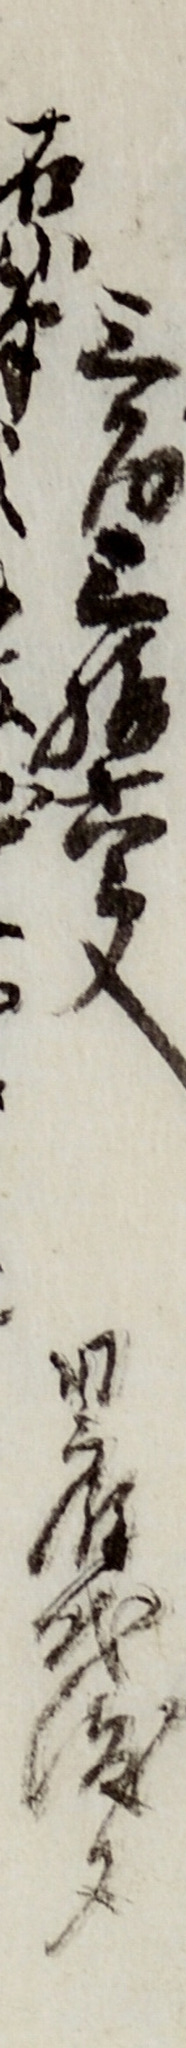三百三拾六文日雇代渡ス
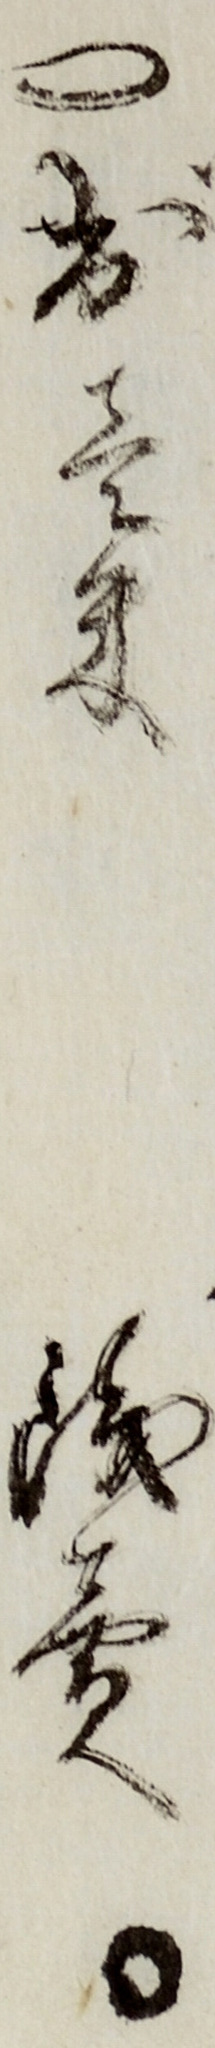〇出壱朱銭売○
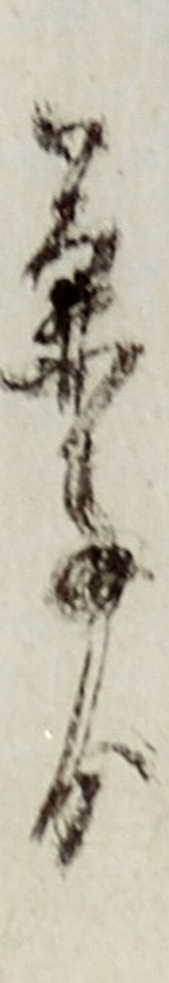兼子ゟ
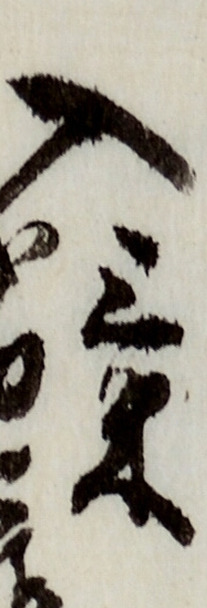出三朱
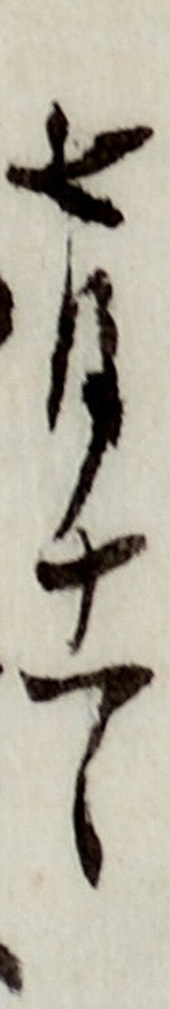七月十一日
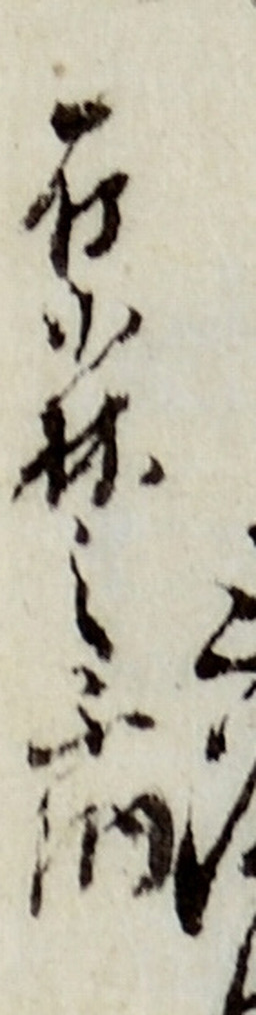右小林之不納
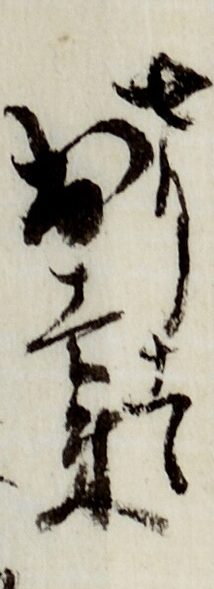出三朱
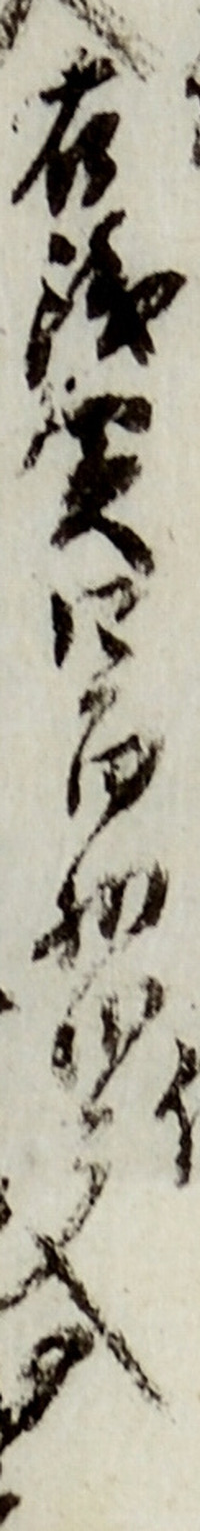右銭買四百拾弐文
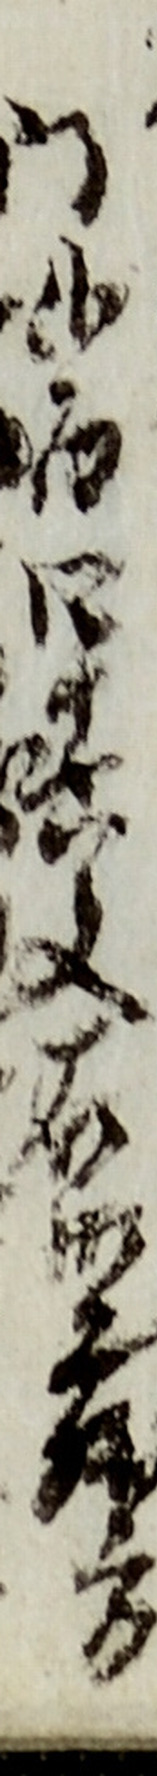内弐百四十六文右御蔵方
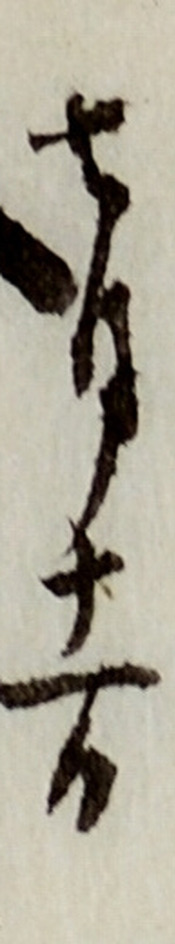七月十一日
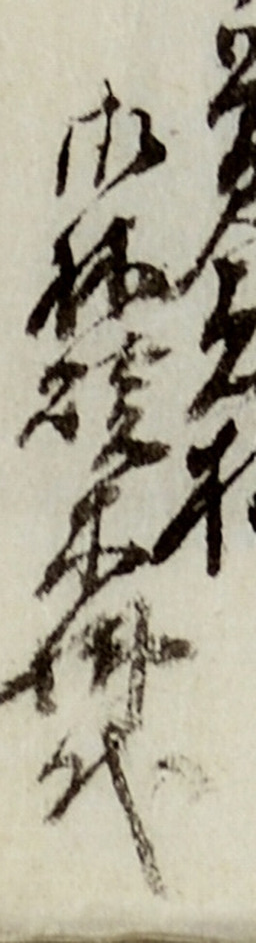御林焼木掛代
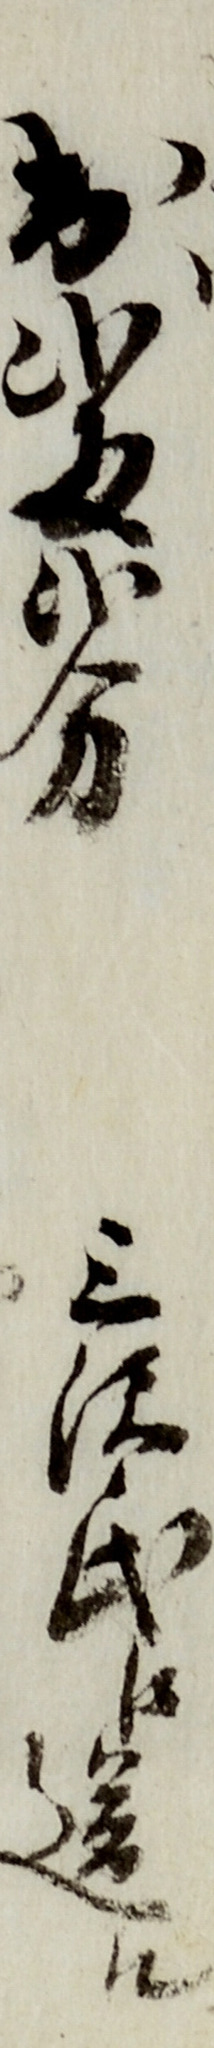出弐両弐分三沢氏江送ル
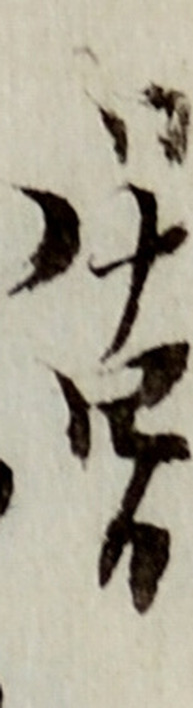同十四日
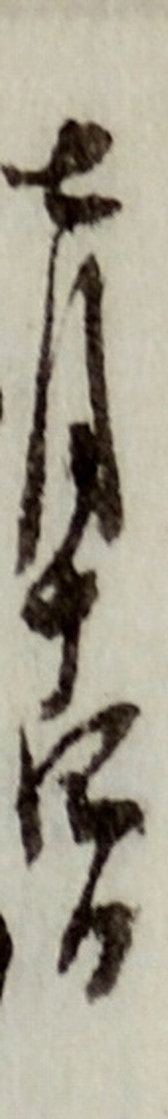七月十四日
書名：中沢郷御竹薮見廻り
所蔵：伊那市立高遠町図書館・合同会社AMANE
